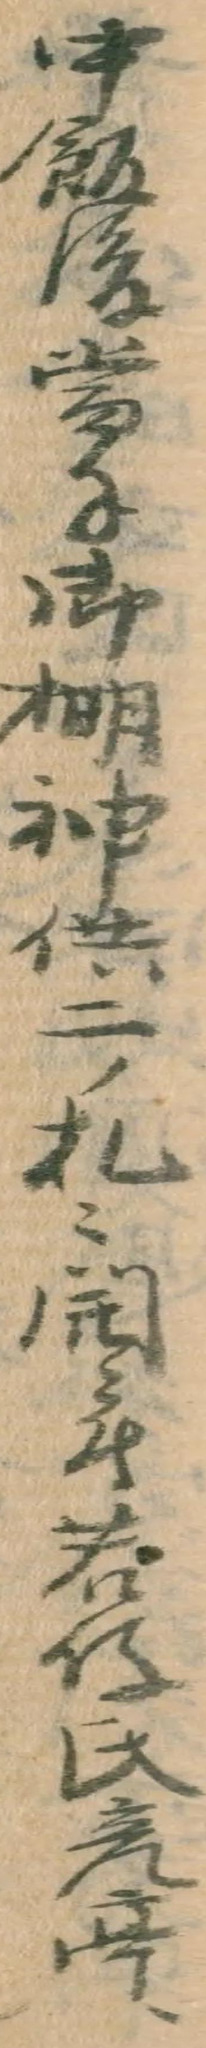中飯後當手御棚神供二ノ札〻開ニ付若役氏産亭へ
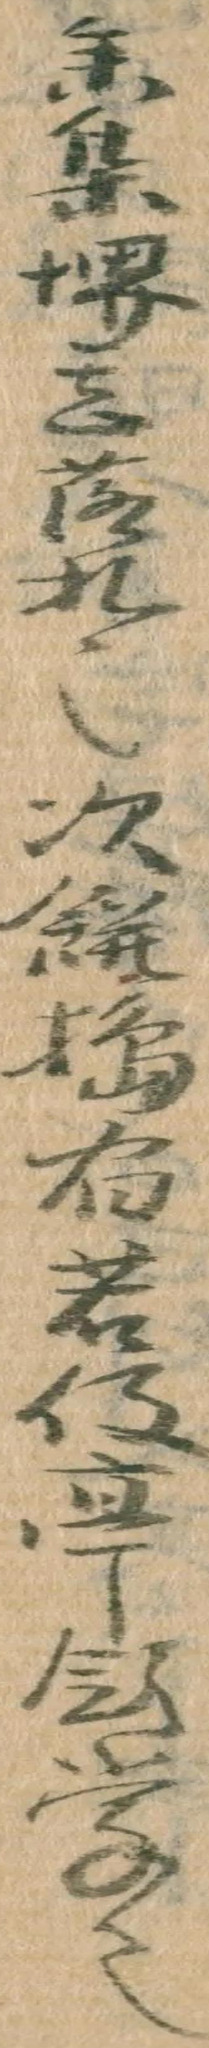参集堺甚落札也次餅搗有若役亭領掌也
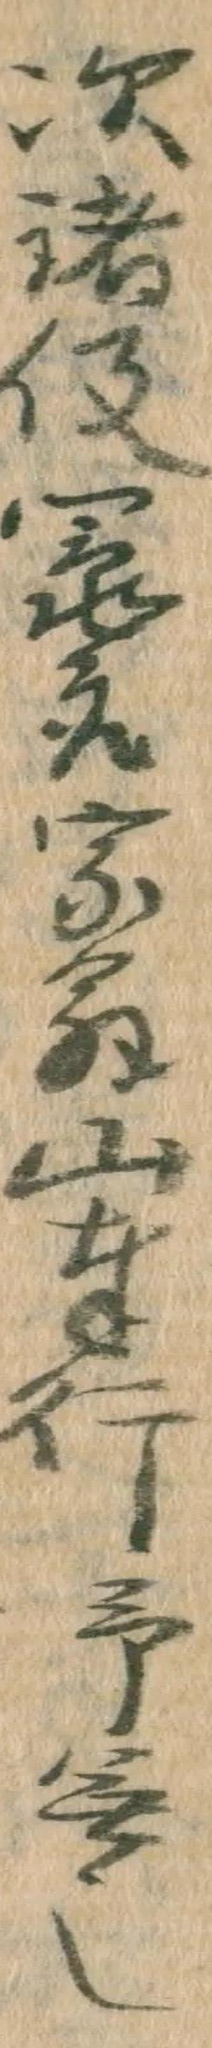次諸役鬮取家翁山奉行予無也
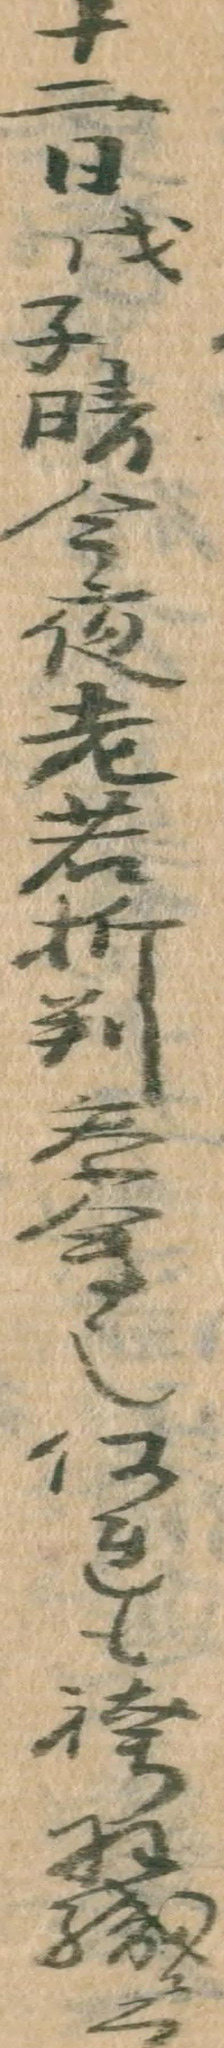十二日戊子晴今夜老若折判参會也何れも袴羽織ニ而
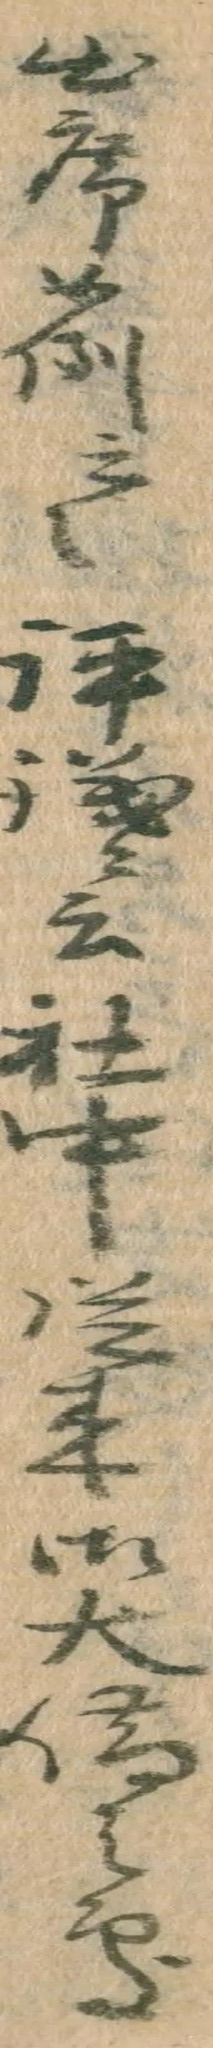出席如例云〻評議ニ云社中従来御大借之處
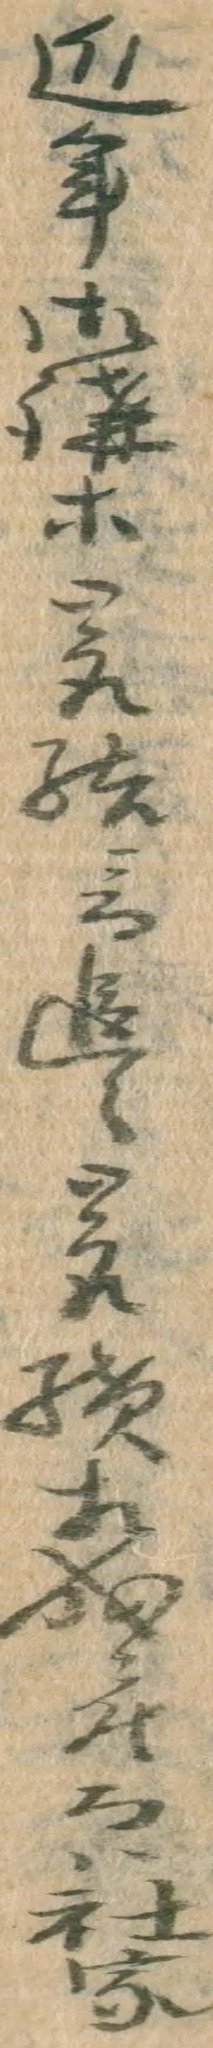近年御構等御取結ニ而追々御取損相成ニ付而ハ社家
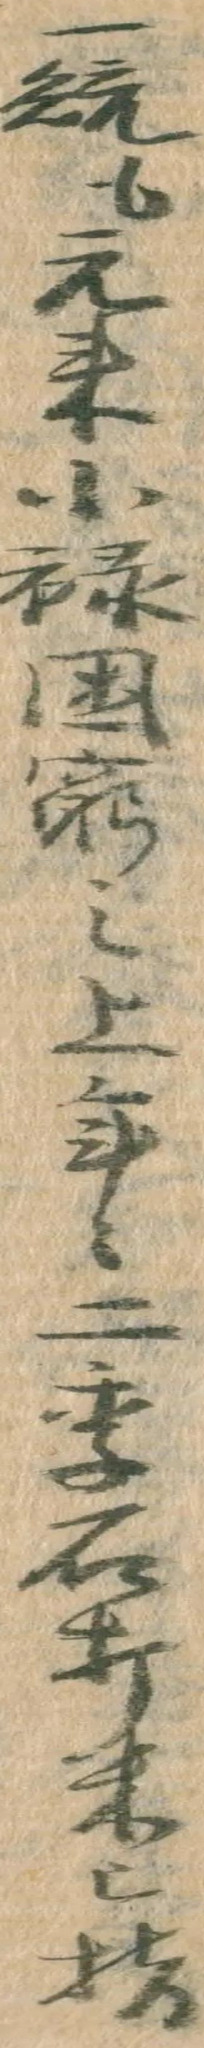一統も元来小禄困窮之上年々二季石打来被指
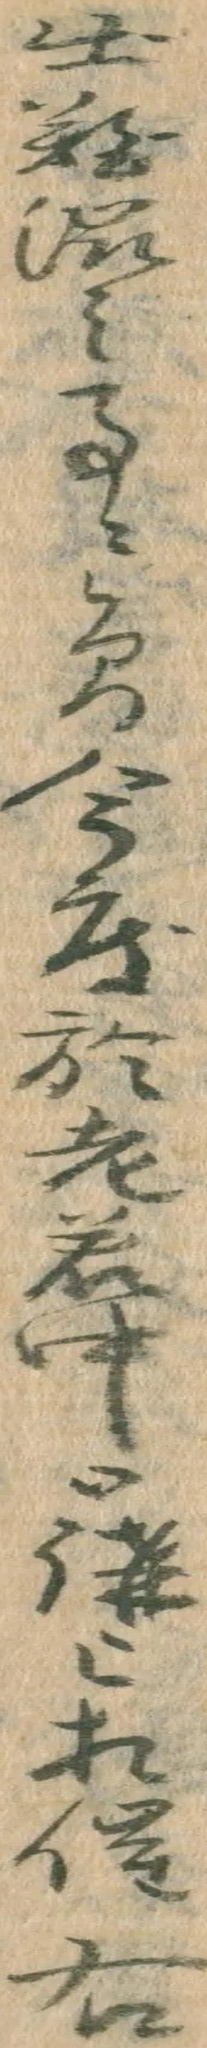出難渋之事ニ候間今度於老若中御講被相催右
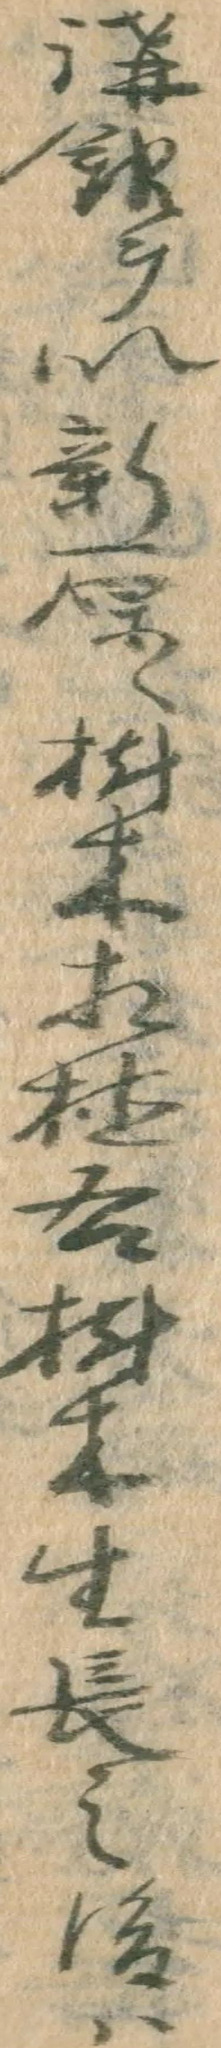講銀ヲ以新原へ樹木相植右樹木生長之後ハ
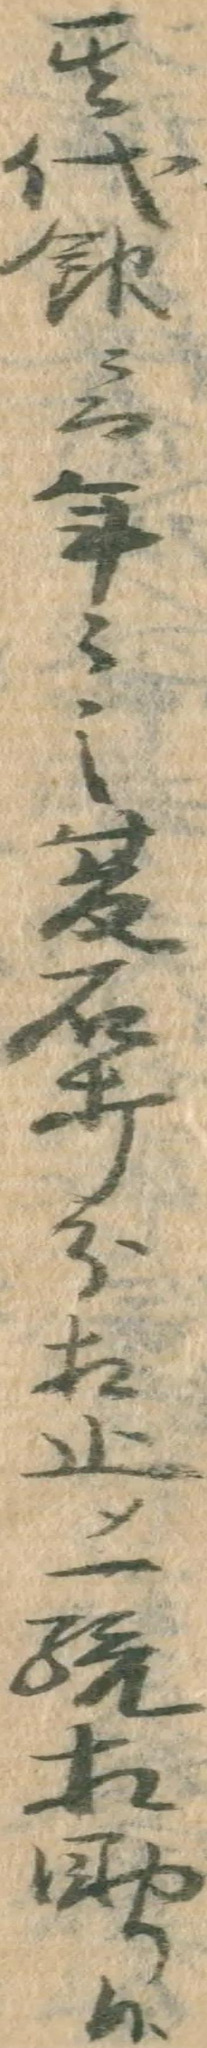其代銀ニ而年々之夏石打分相止メ一統相助リ候
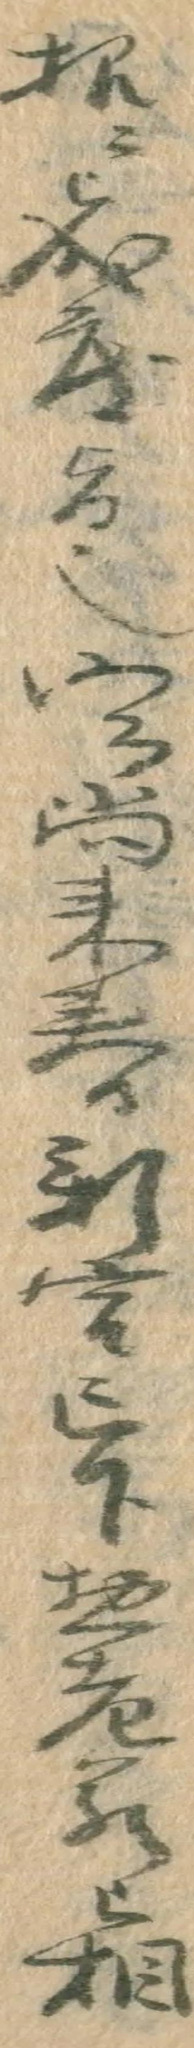様ニ被成度旨也仍而尚来春新宮被下惣老若被相
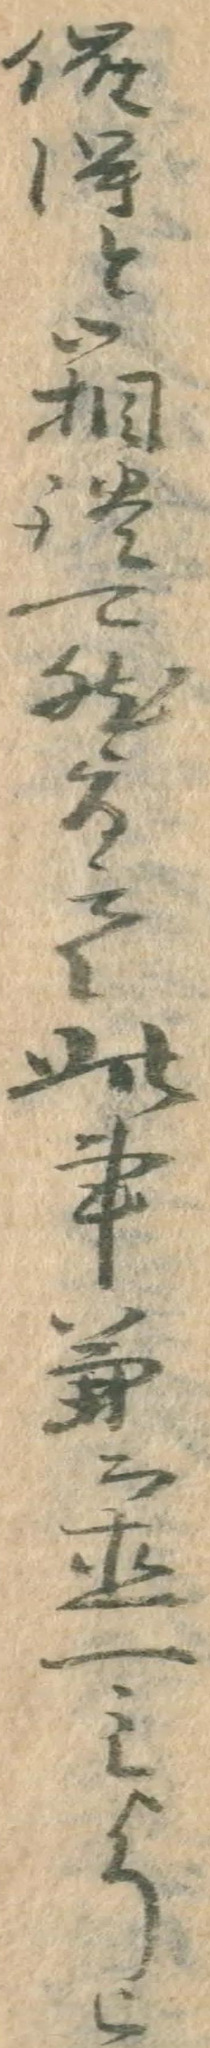催得と御相談可然旨云々此事兼而直一之より被

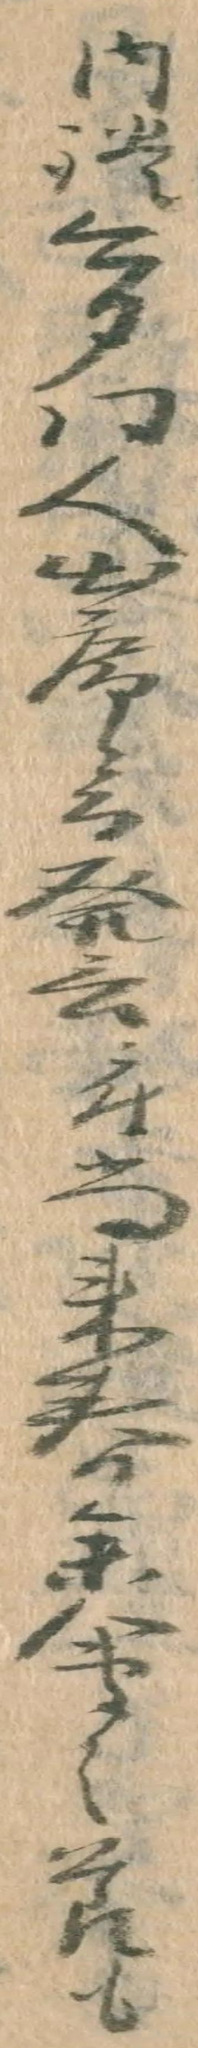内談今夕同人出席ニ而発言ニ付當来春参會之節も
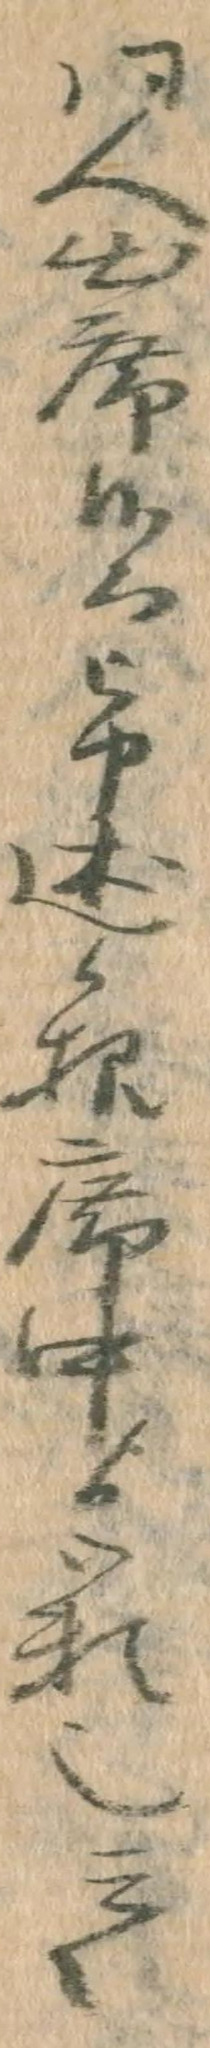同人出席候而被申述候様席中ゟ御頼也云々
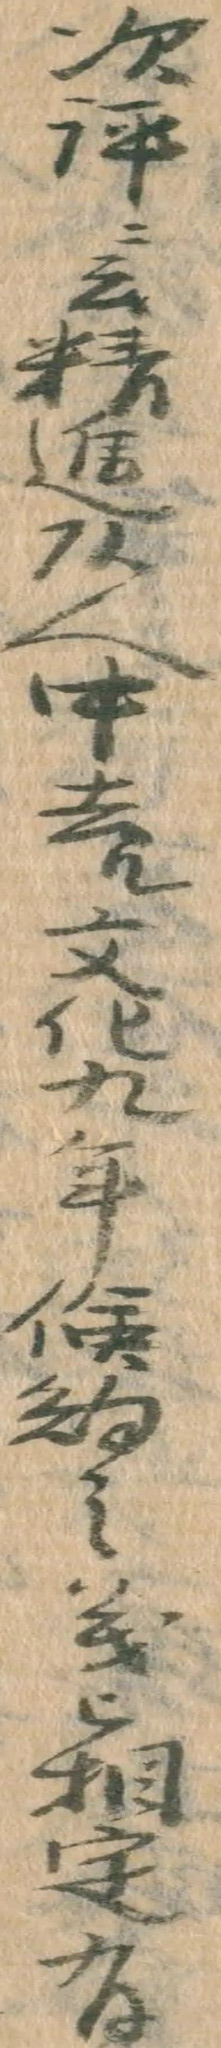次評ニ云精進頂人中去ル文化九年倹約之義被相定有
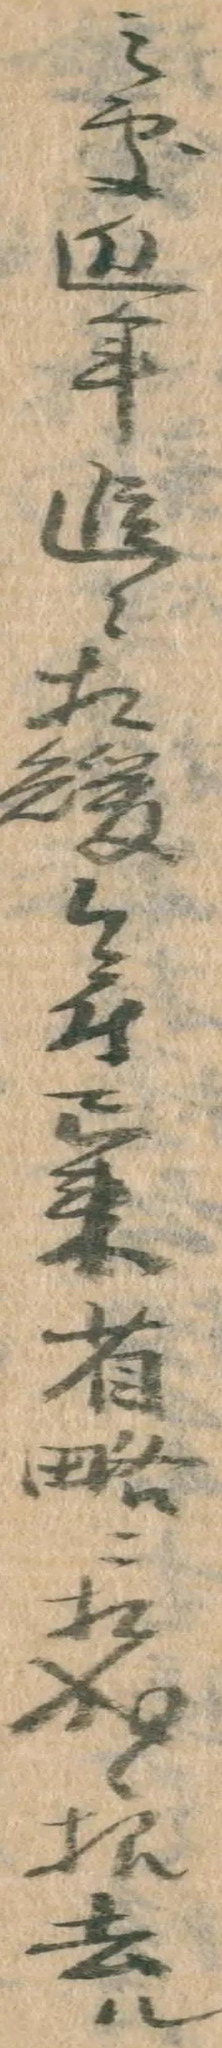之處近年追々相緩候ニ付已来省略ニ相成候様去ル
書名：賀茂社記録. 第63冊
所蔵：国立国会図書館 National Diet Library, JAPAN
